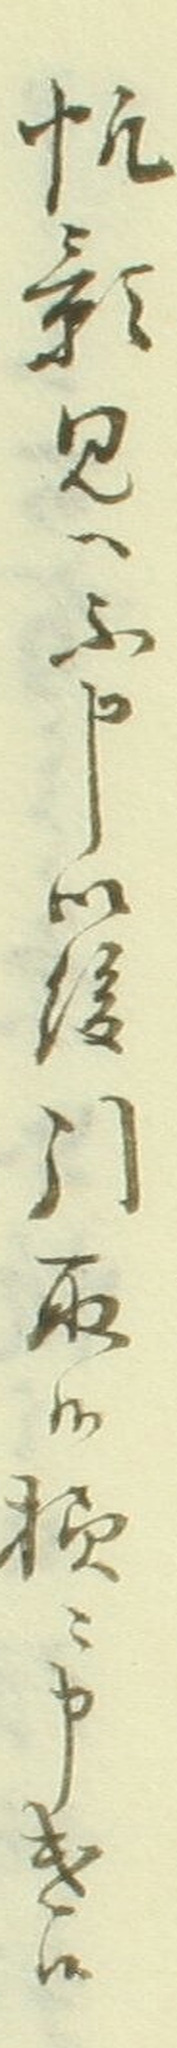帆影見へ不申以後引取候様に申遣候
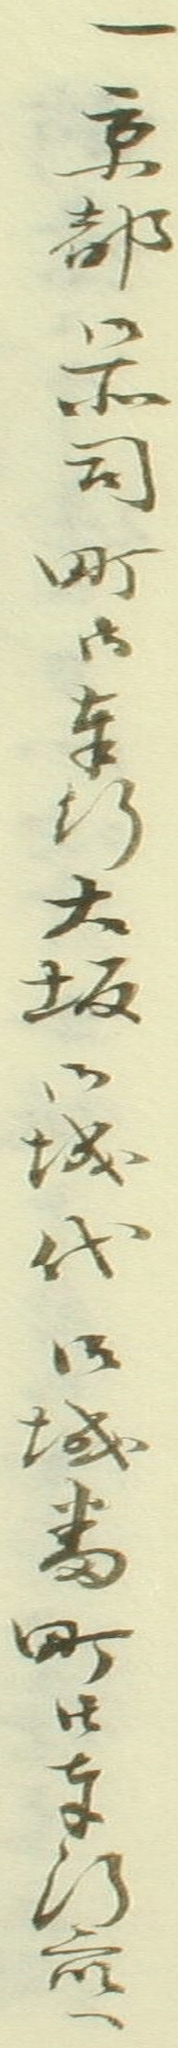一京都御所司町奉行大坂御城代御城番町御奉行衆へ
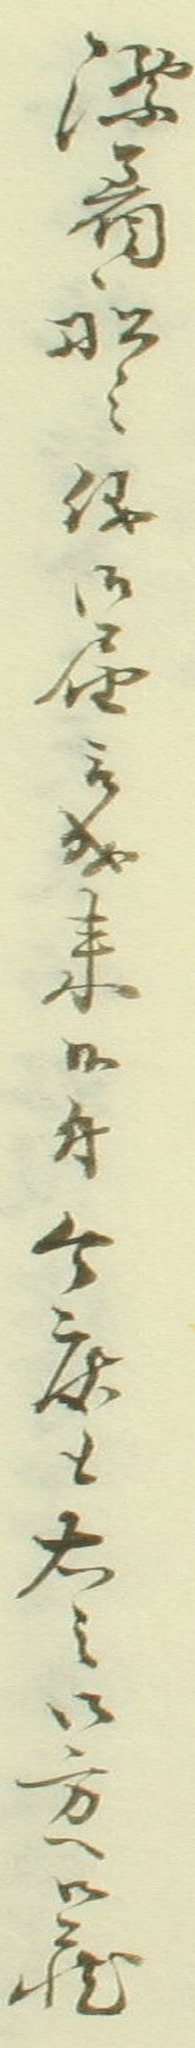漂着船之儀御届被成来候今度も右之御方へ御蔵
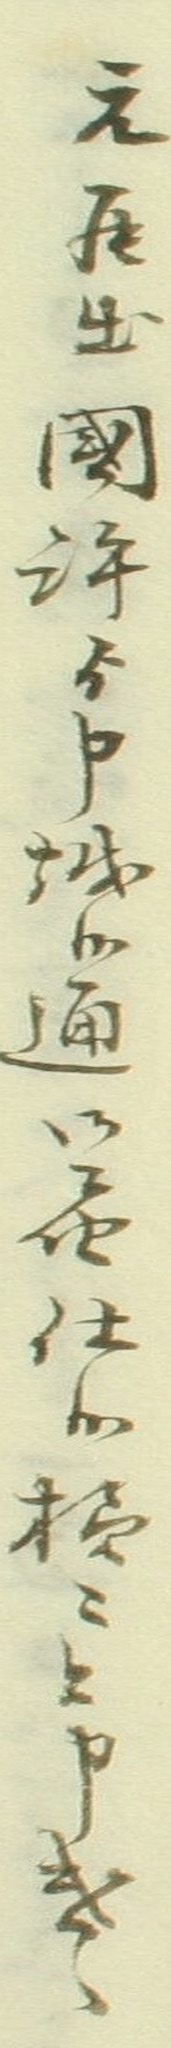元罷出国許ゟ申越候通御届仕候様にと申遣候
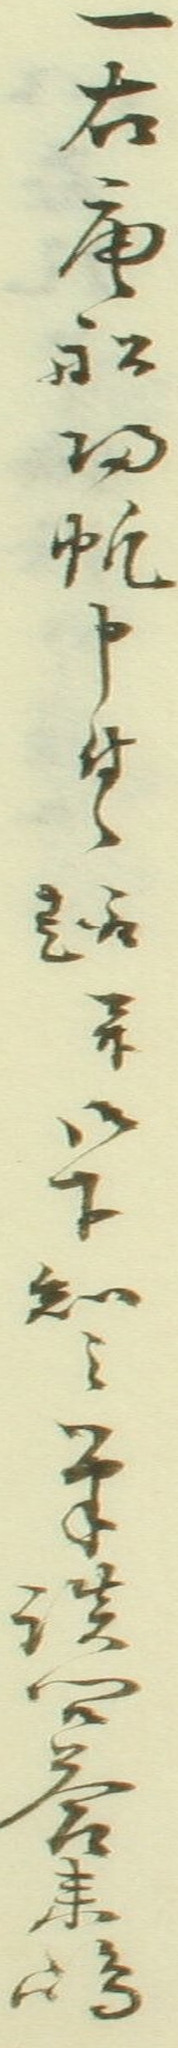一右唐船帰帆申付候趣并御下知之筆談問答来嶋
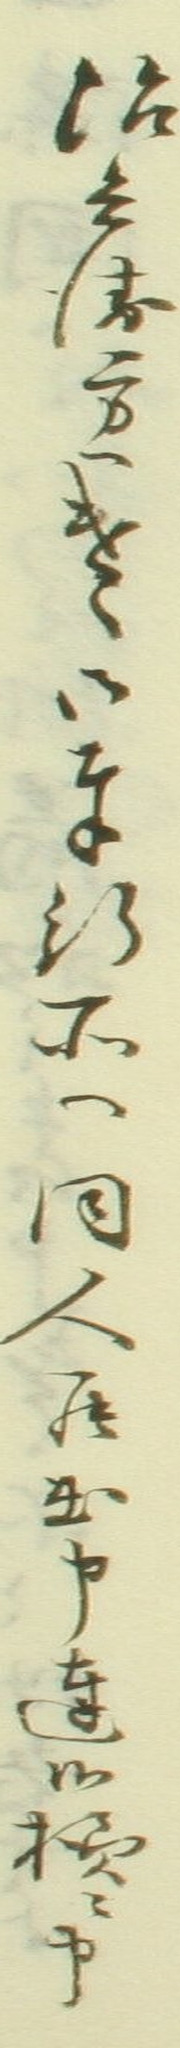治兵衛方へ遣候御奉行所へ同人罷出申達候様に申
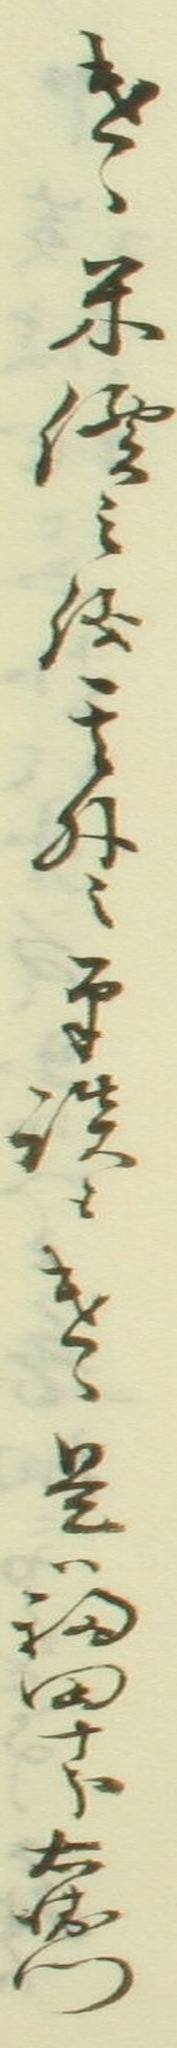遣候米価之儀其外之筆談も遣候是は福田十郎右衛門

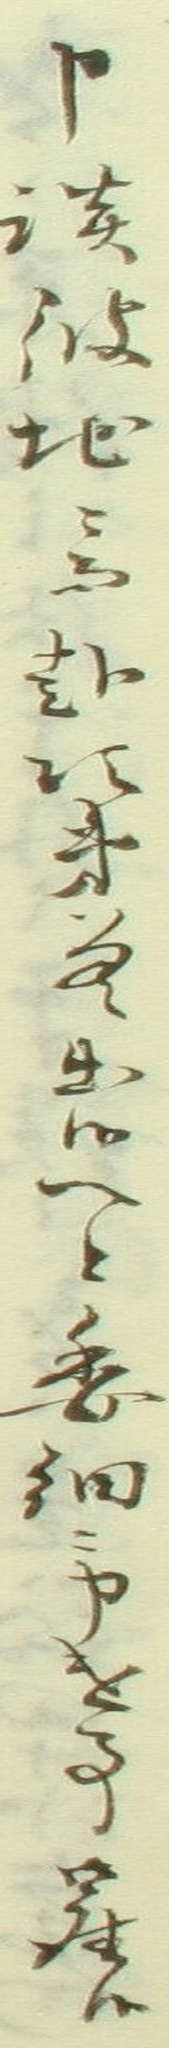申談彼地に而赴次第差出候へと委細に申遣事御座候
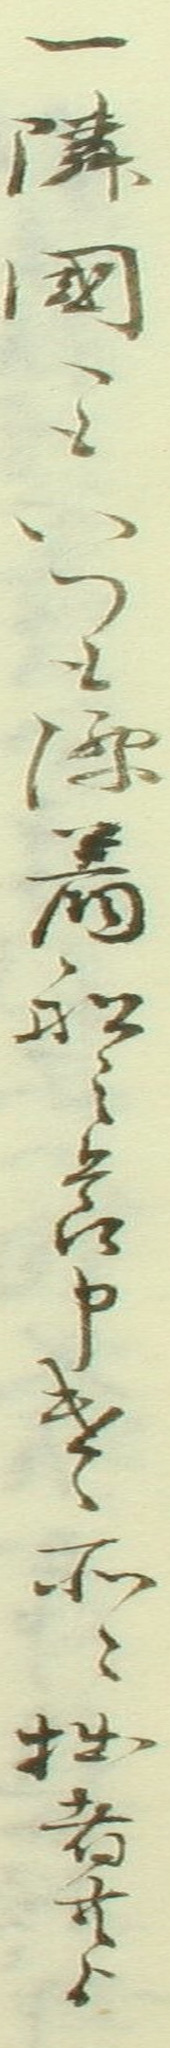一隣国へもいつも漂着船之節申遣候所々拙者共ゟ
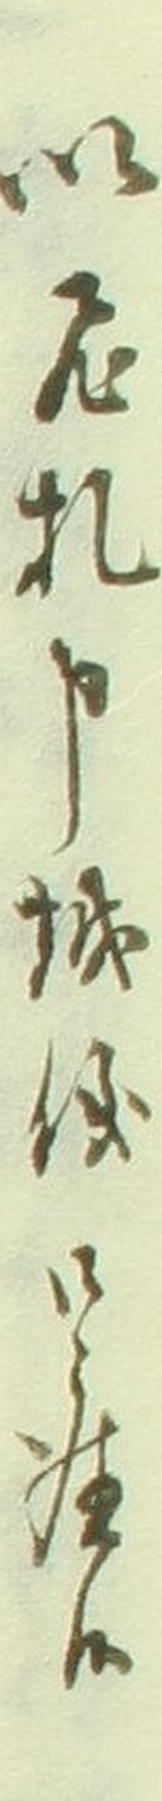以飛札申越儀御座候
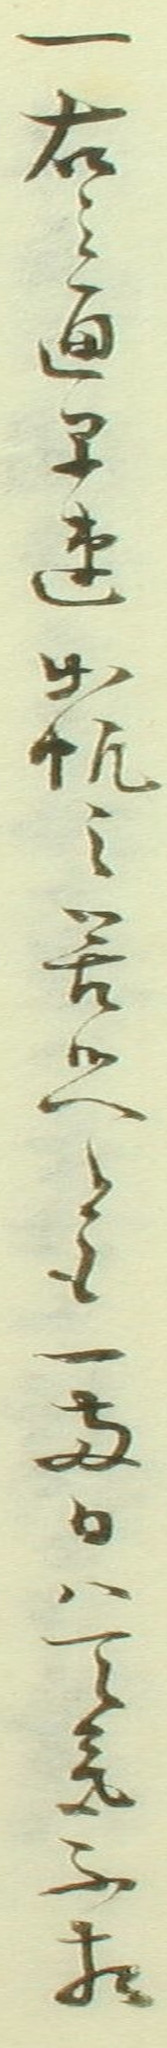一右之通早速出帆之筈候へとも一両日は天気不相
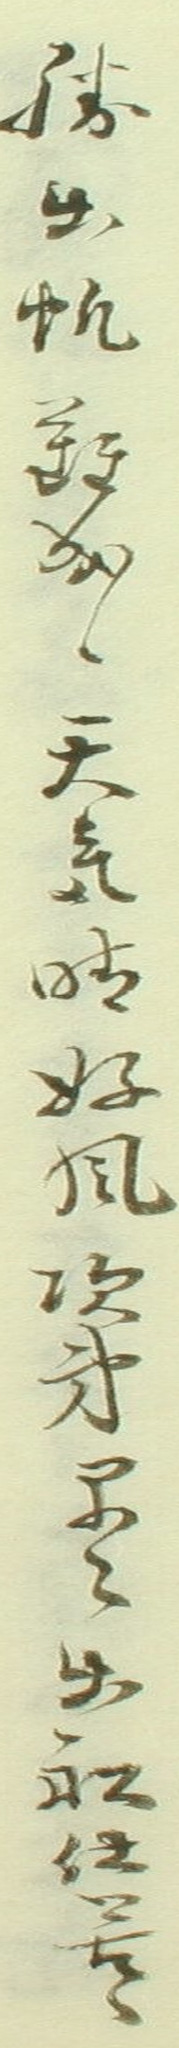勝出帆難成候天気晴好風次第早々出船仕筈候
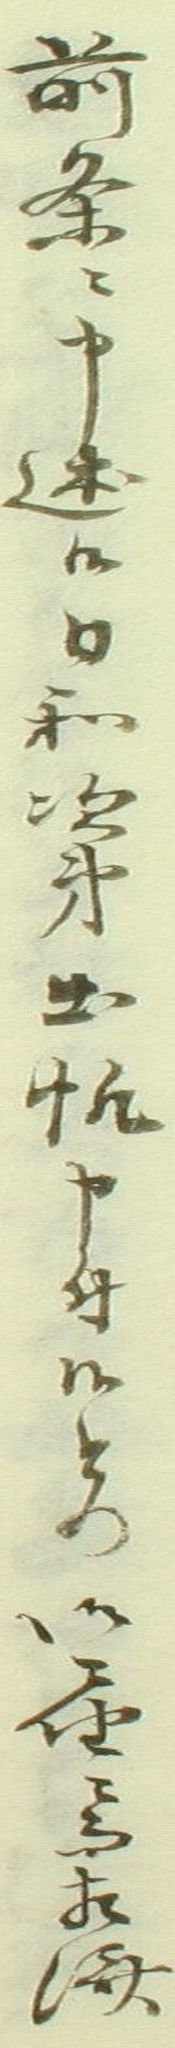前条に申述候日和次第出帆申付候との御届に而相済
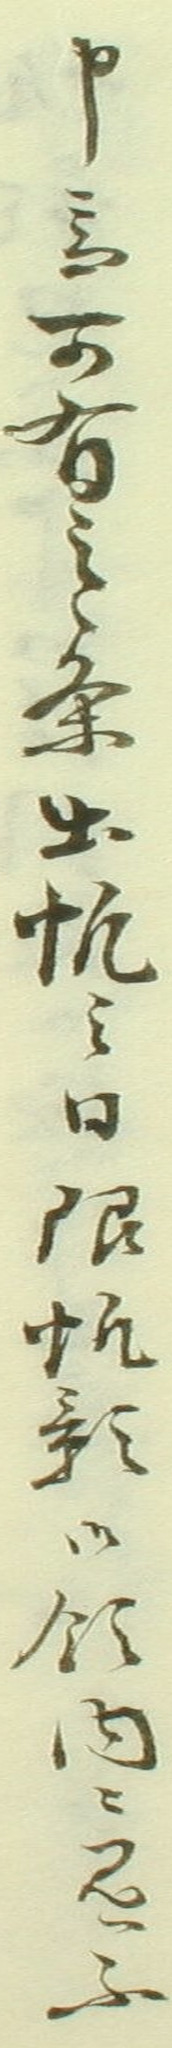申に而可有之候条出帆之日限帆影御領内に見へ不
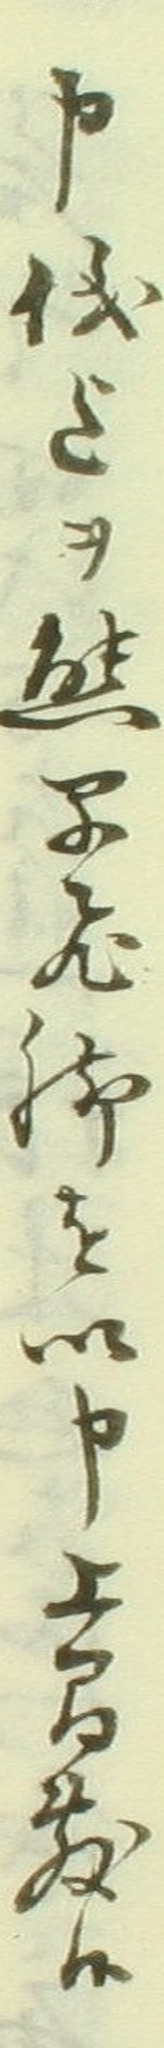申儀迄を態早飛脚を以申上間敷候
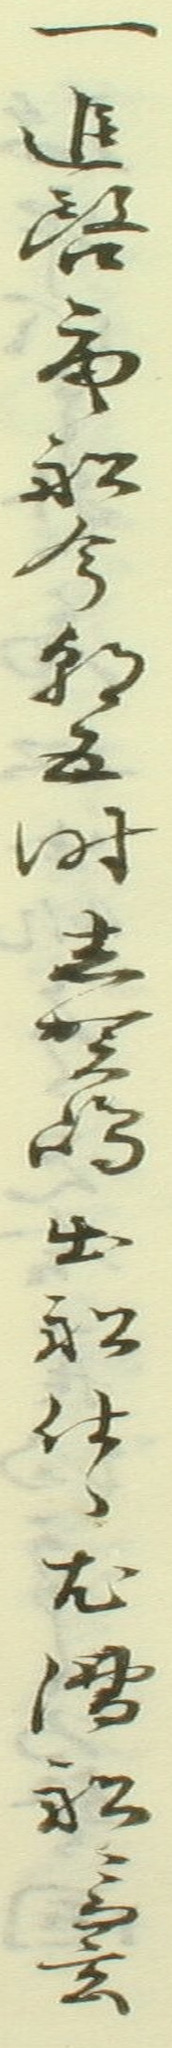一追啓唐船今朝五時志賀島出船仕候尤漕船に而玄
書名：異国船漂着記
